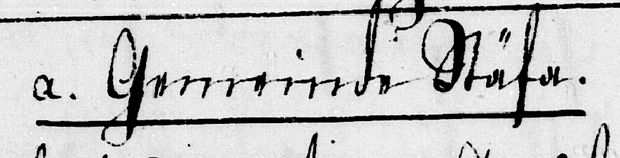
a. Gemeinde Stäfa
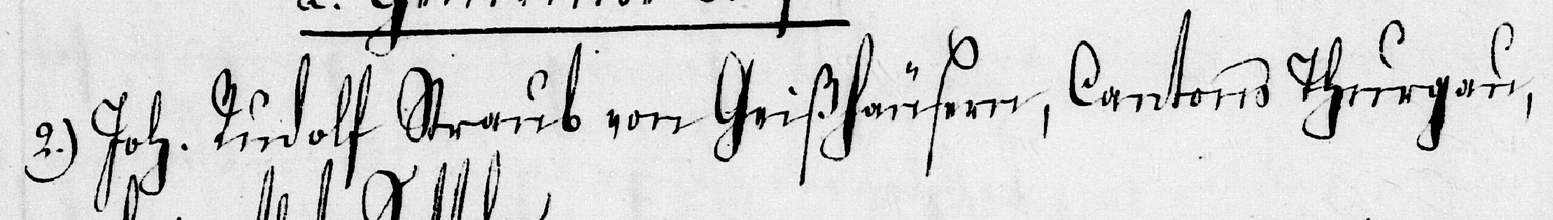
2.) Joh. Rudolf Straub von Geißhäusern, Cantons Thurgau,
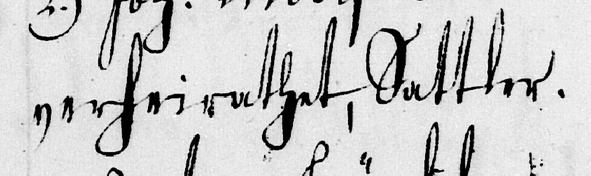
verheirathet, Sattler.
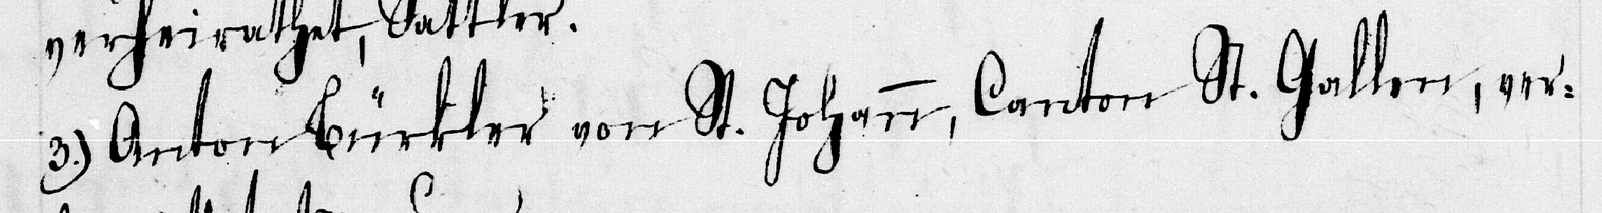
3.) Anton Bürkler von St. Johann, Canton St.Gallen, ver¬
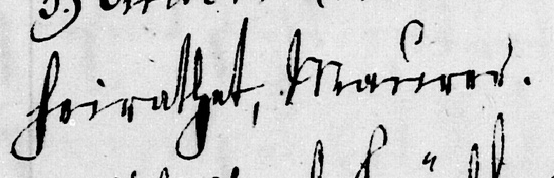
heirathet, Maurer.
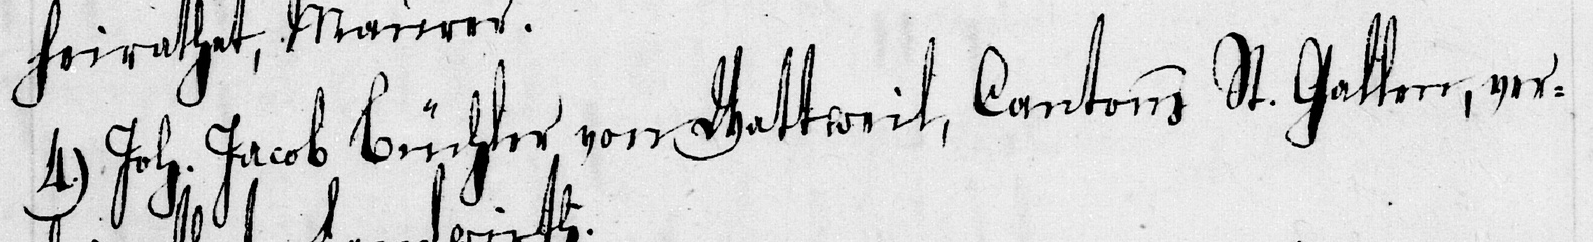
4.) Joh. Jacob Büchler von Wattweil, Cantons St. Gallen, ver¬
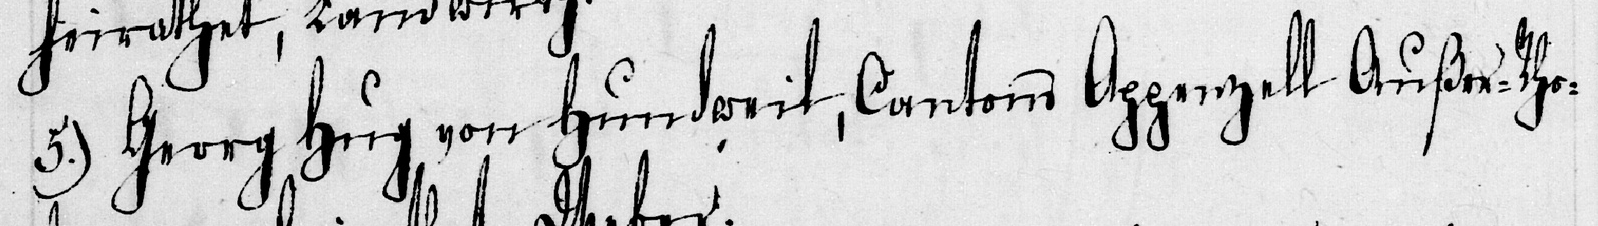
5.) Georg Hug von Hundweil, Cantons Appenzell Außer-Rho¬
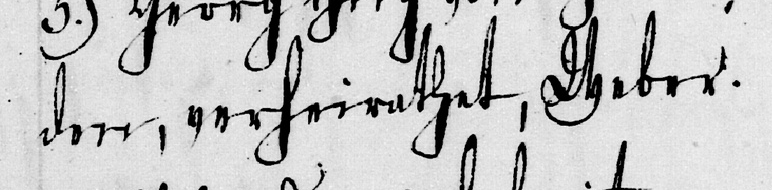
den, verheirathet, Weber.
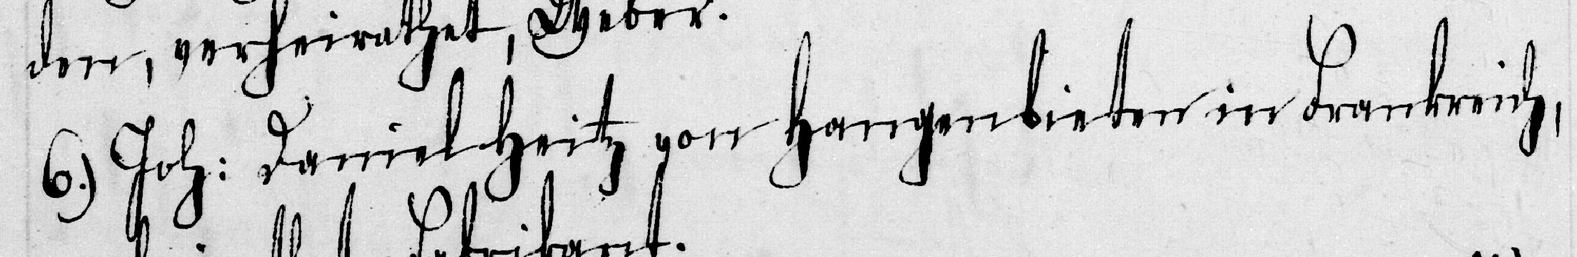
6.) Joh: Daniel Heitz von Hangenbieten in Frankreich,
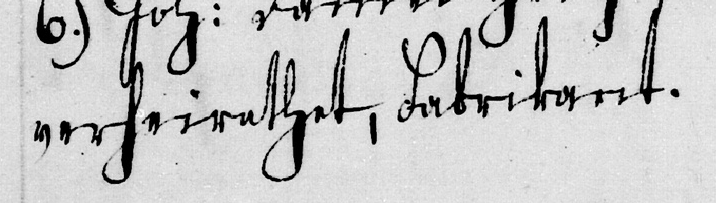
verheirathet, Fabrikant.
